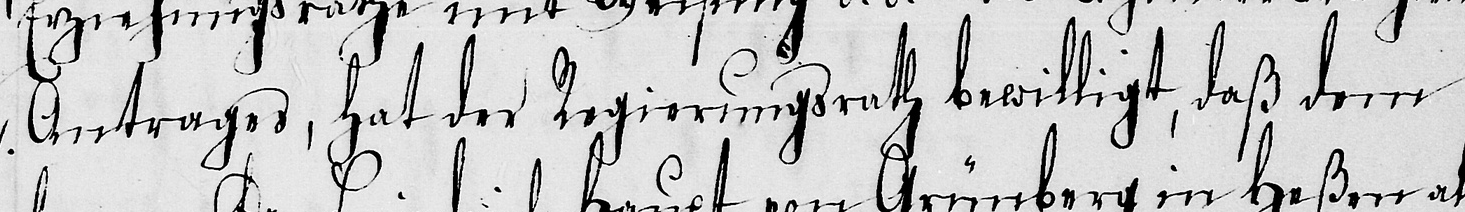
Antrages, hat der Regierungsrath bewilligt, daß dem
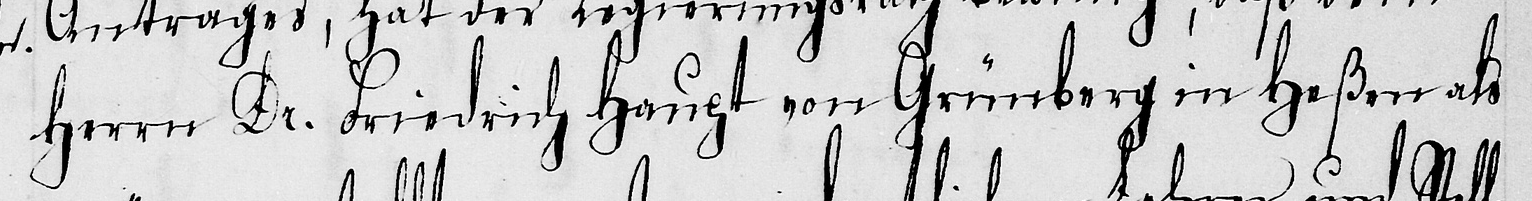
Herrn Dr. Friedrich Haupt von Grünberg in Heßen als
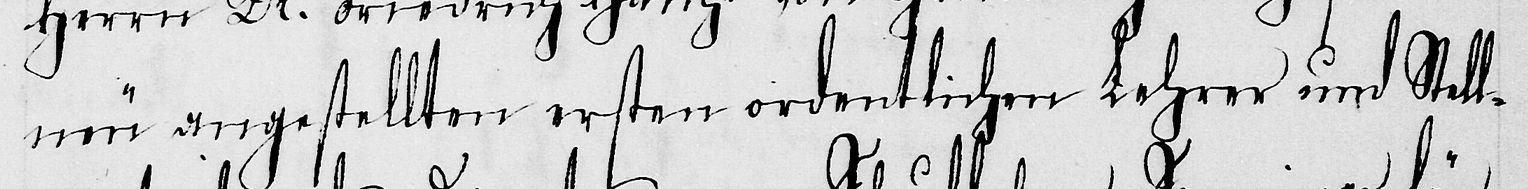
neu angestellten ersten ordentlichen Lehrer und Stel¬
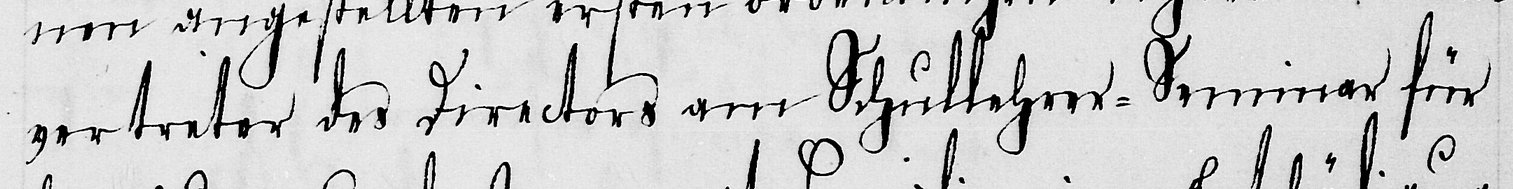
lvertreter des Directors am Schullehrer-Seminar für
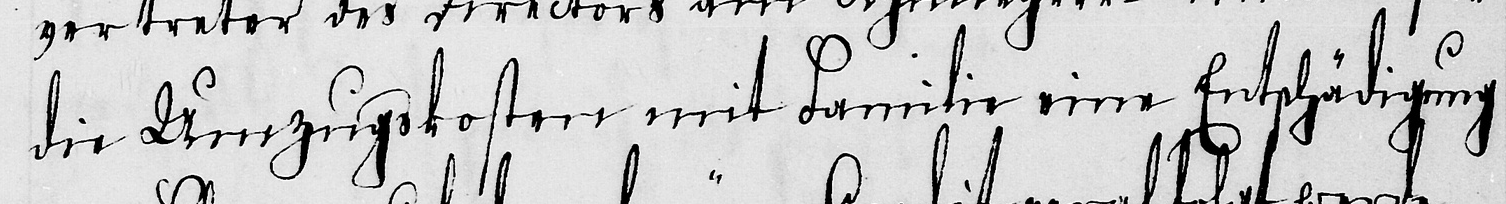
die Umzugskosten mit Familie eine Entschädigung
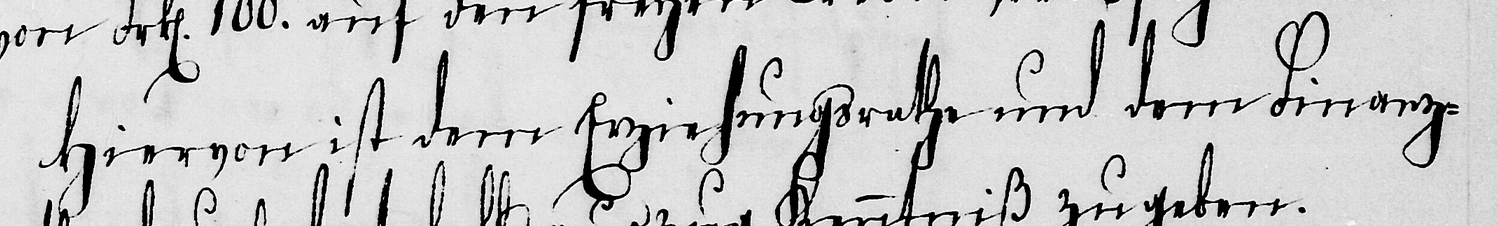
Hiervon ist dem Erziehungsrathe und dem Finanz¬
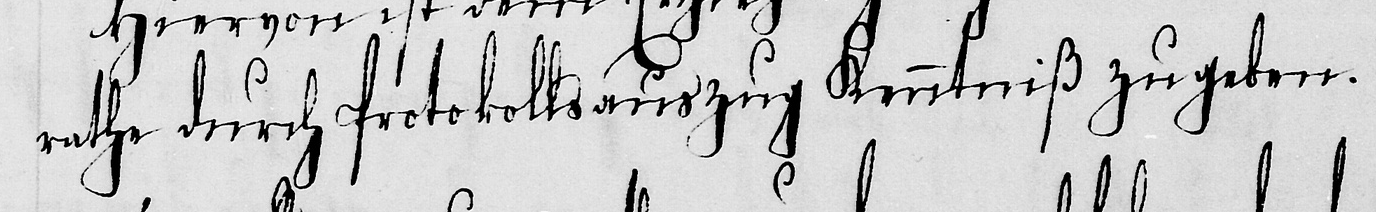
rathe durch Protokollsauszug Kenntniß zu geben.
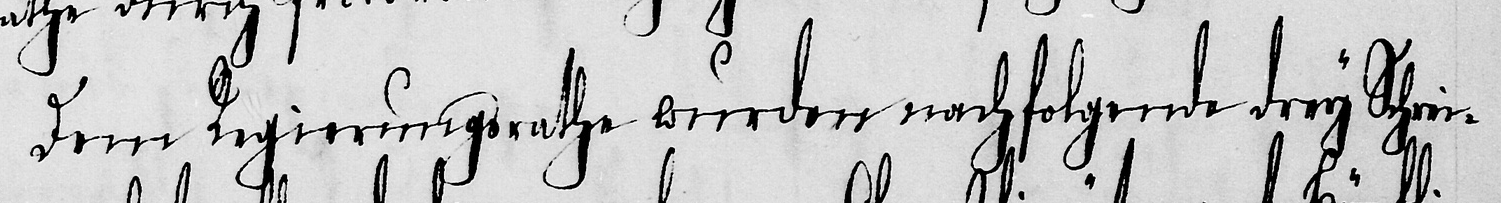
Dem Regierungsrathe wurden nachfolgende drey Schrei¬
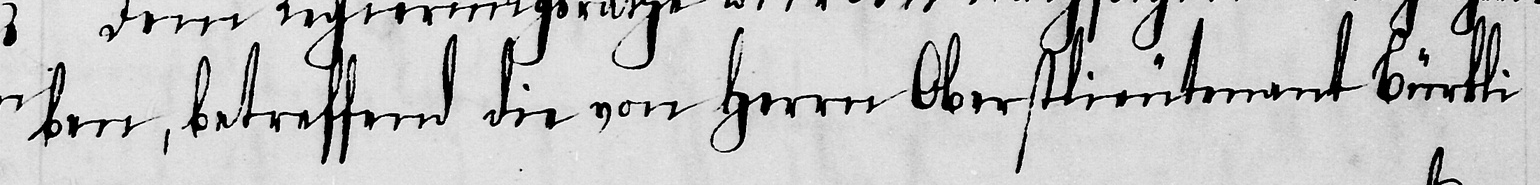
ben, betreffend die von Herrn Oberstlieutenant Bürkli
